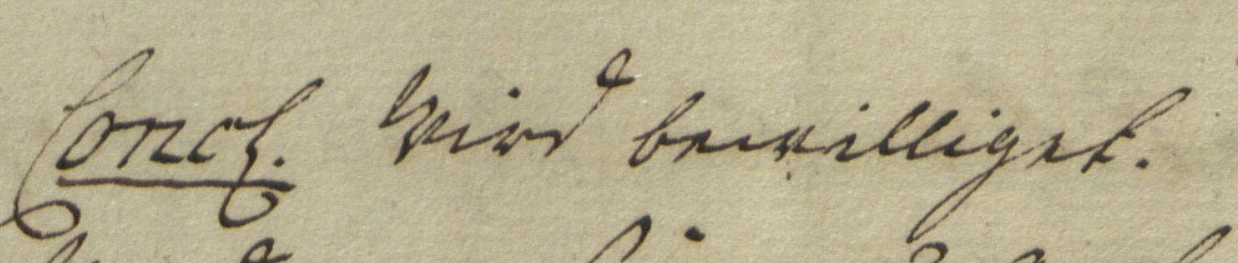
Concl. Wird bewilliget.
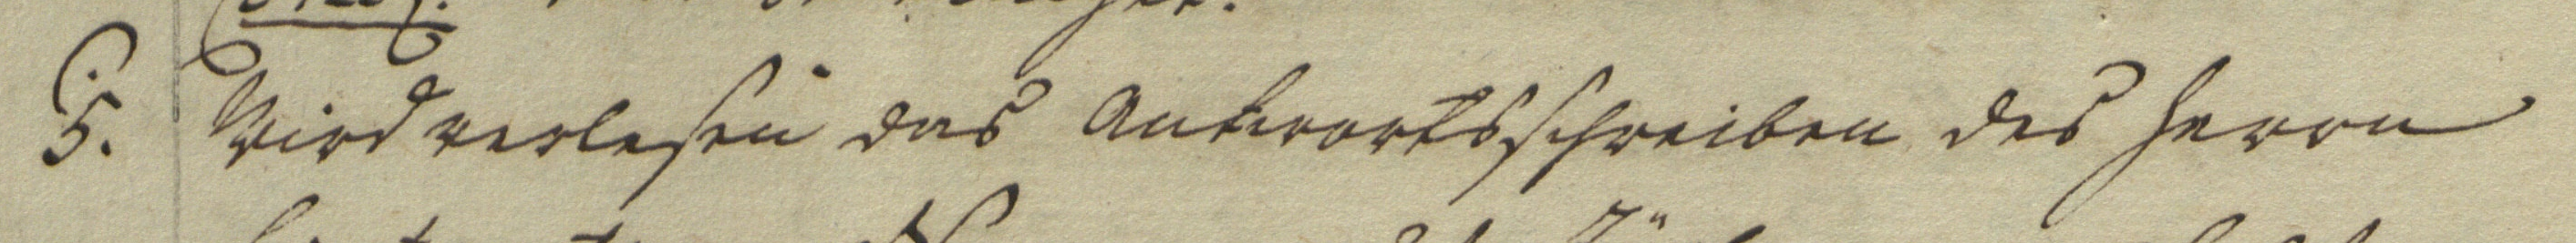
5. Wird verlesen das Antwortsschreiben des Herrn
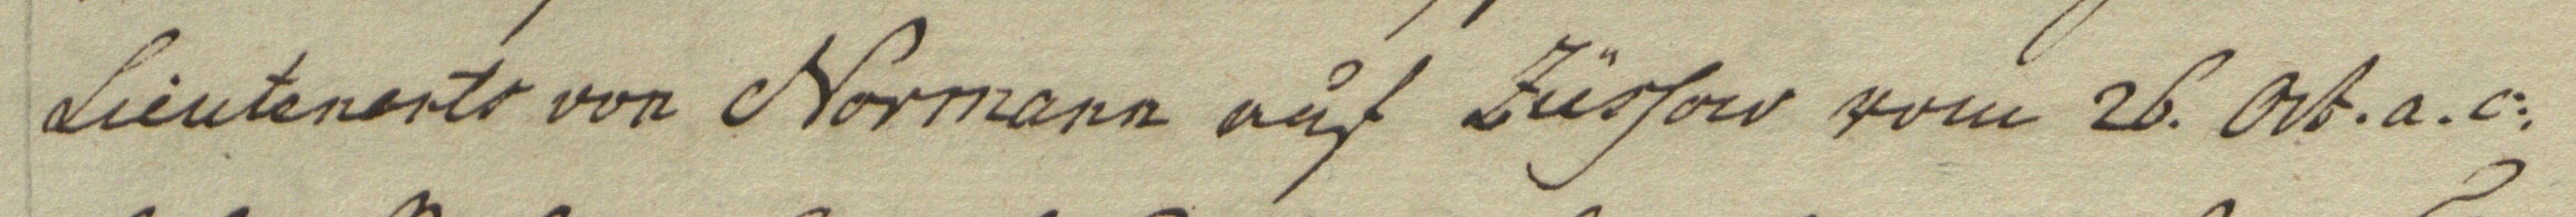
Lieutenants von Normann auf Züssow vom 26. Oct. a. c.
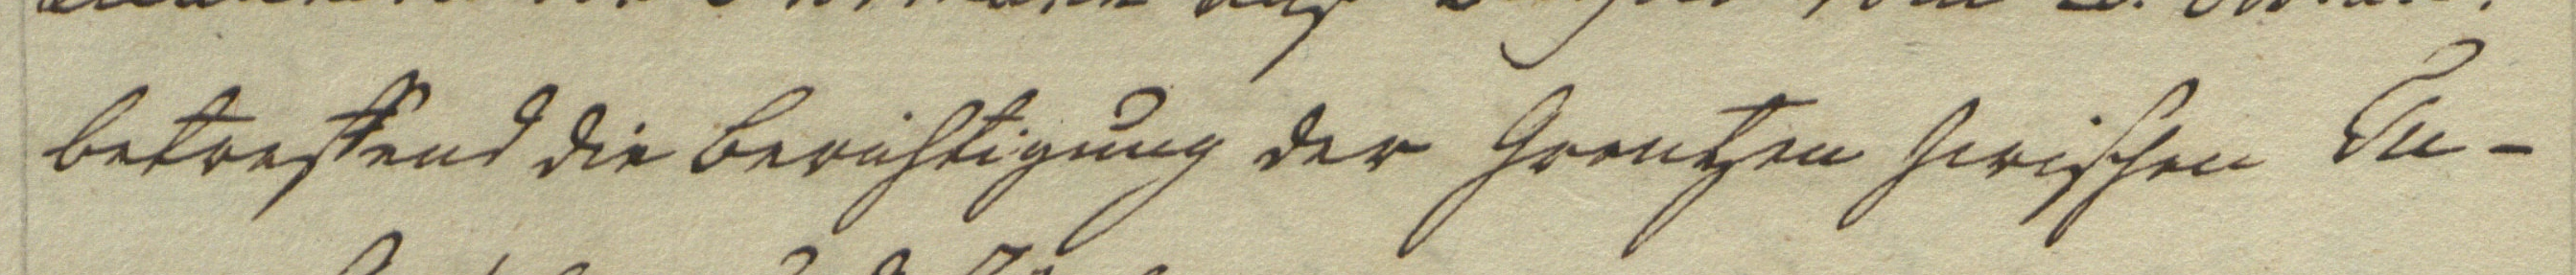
betreffend die Berichtigung der Grentzen zwischen Tu¬
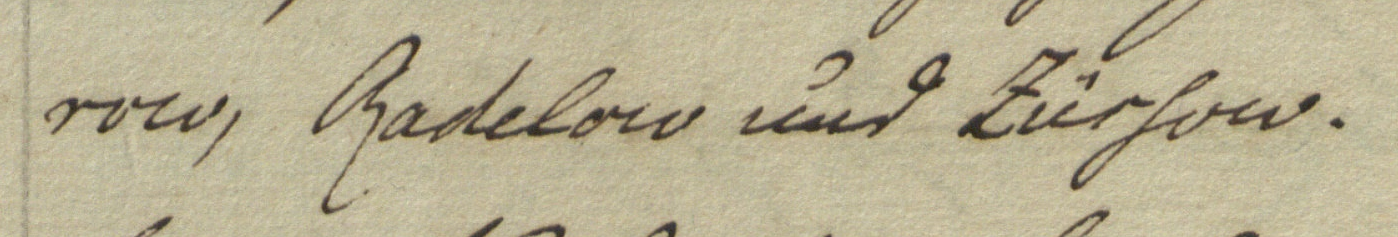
row, Radelow und Züssow.
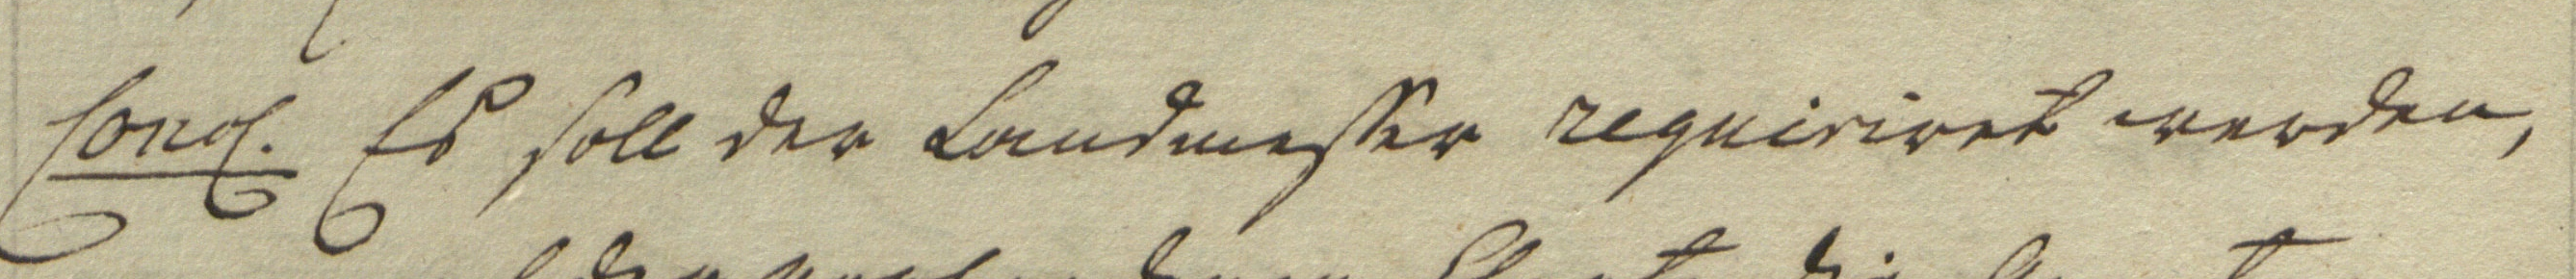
Concl. Es soll der Landmesser requiriret werden,
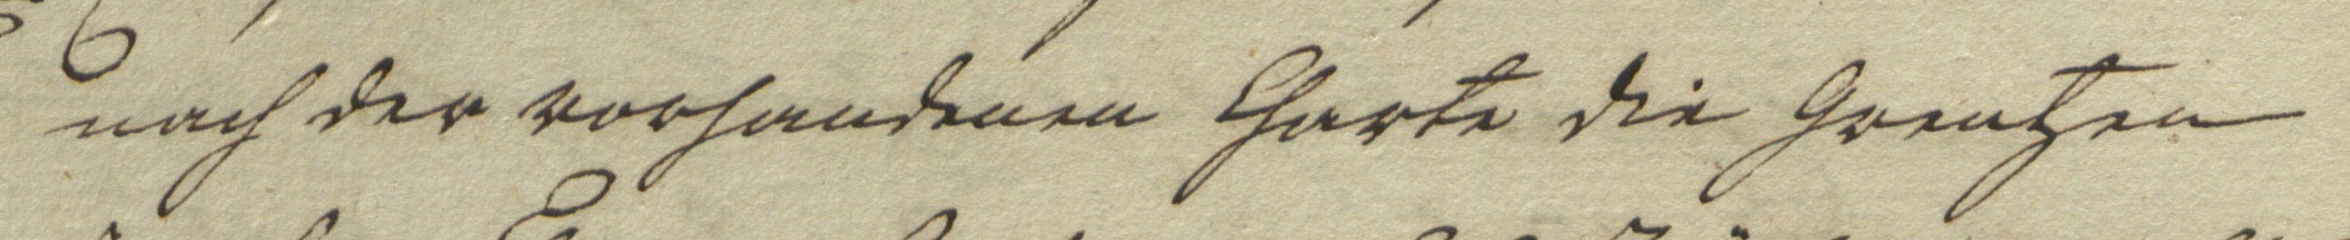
nach der vorhandenen Charte die Grentzen
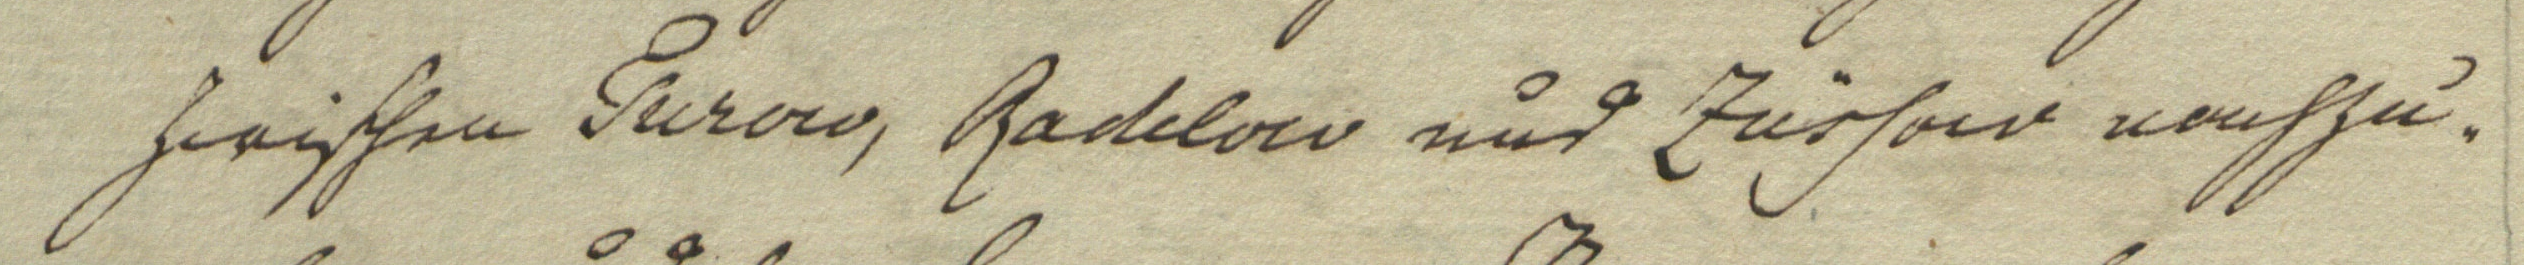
zwischen Turow, Radelow und Züssow nachzu¬
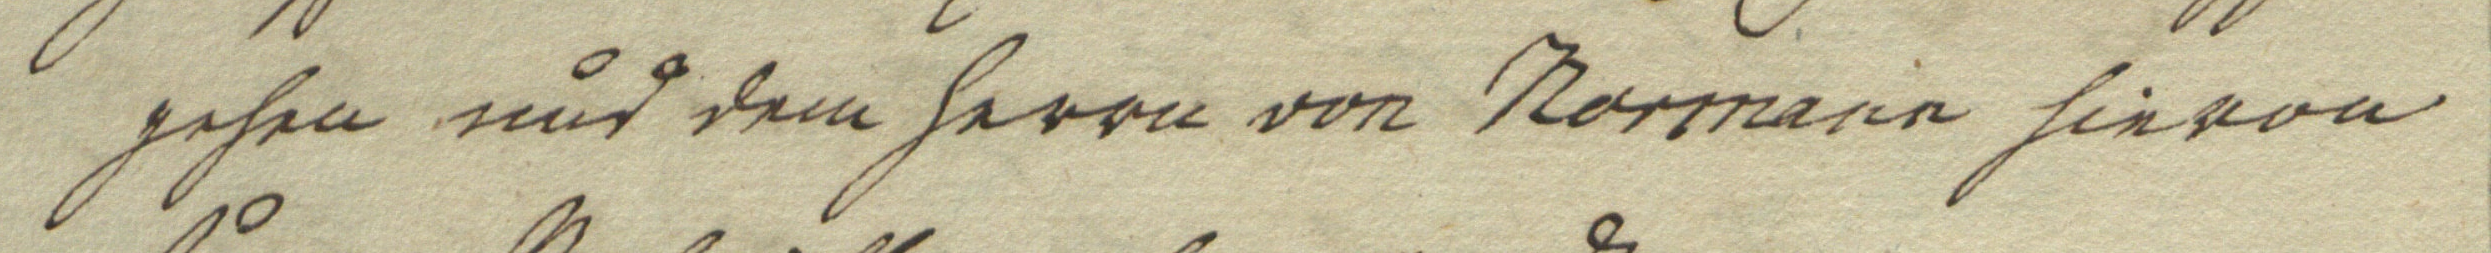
gehen und dem Herrn von Normann hievon
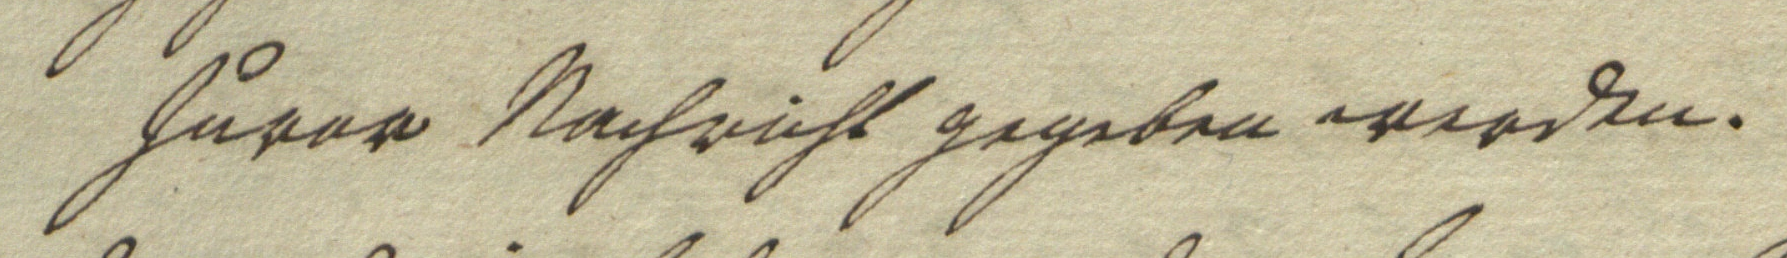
zuvor Nachricht gegeben werden.
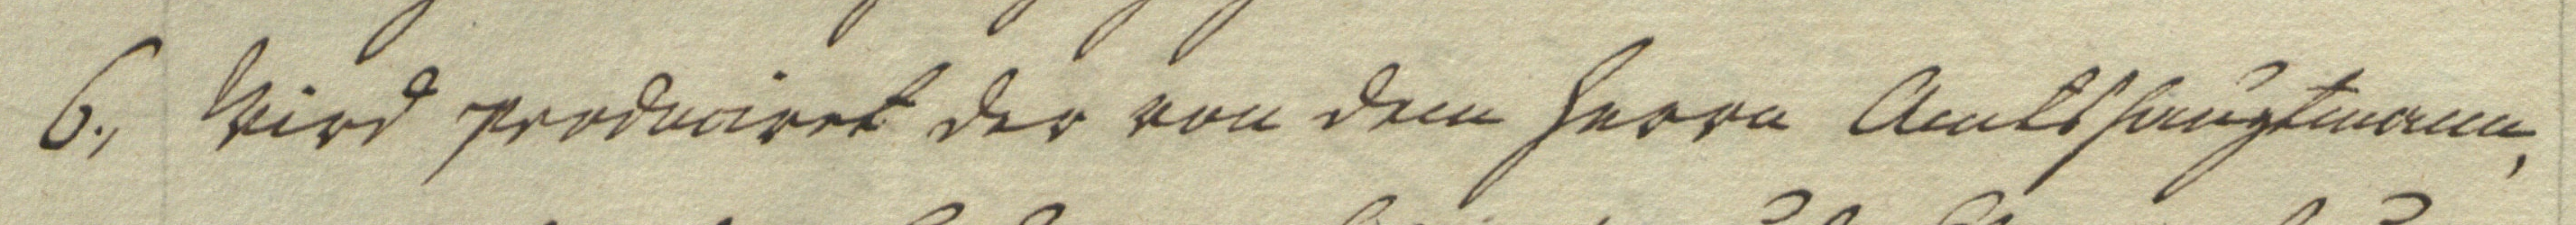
6., Wird produciret der von dem Herrn Amtshauptmann,
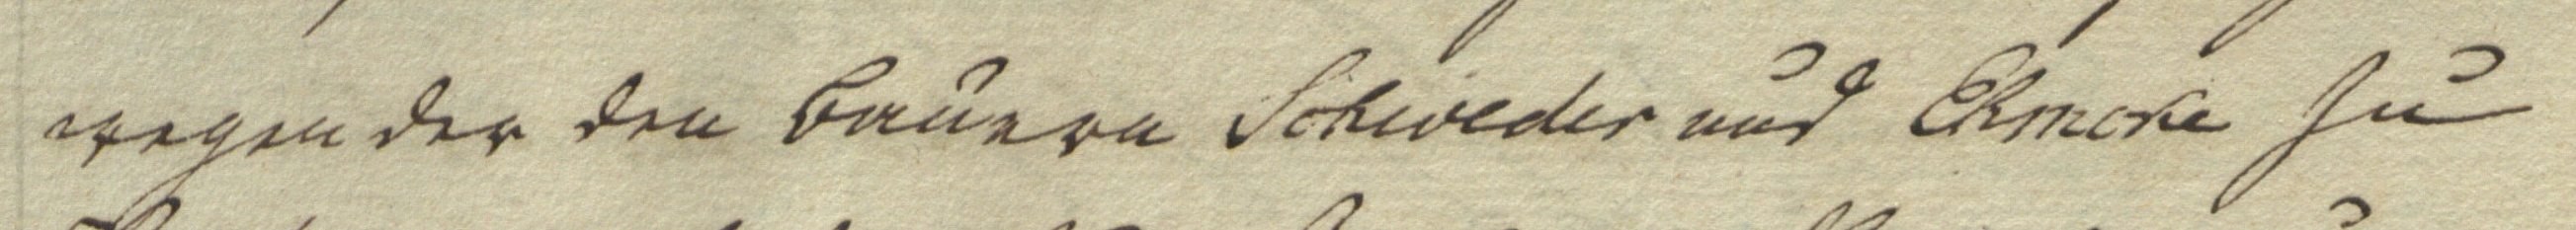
wegen der den Bauern Schweder und Ehmcke zu
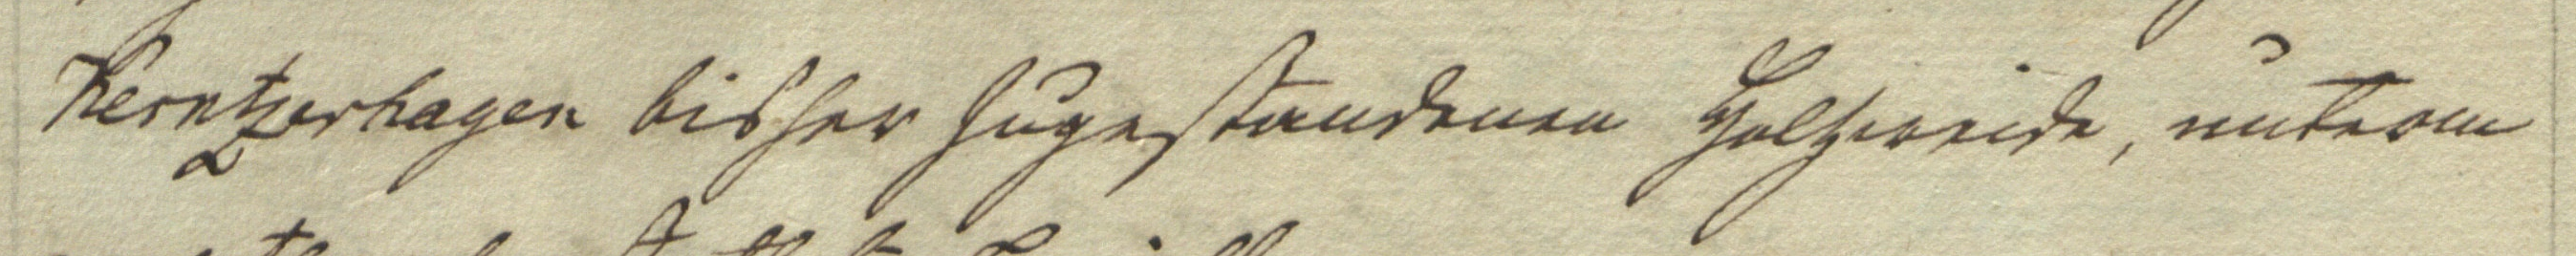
Kemtzerhagen bisher zugestandenen Holzweide, unterm
